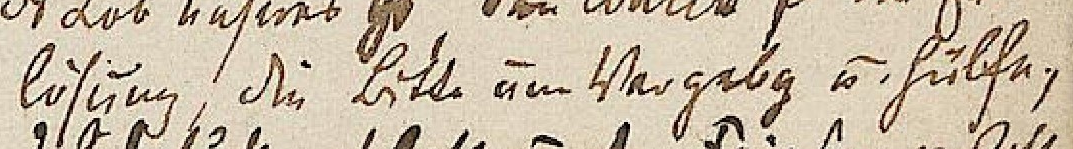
lösung, die Bitte um Vergebg. u. Hülfe,
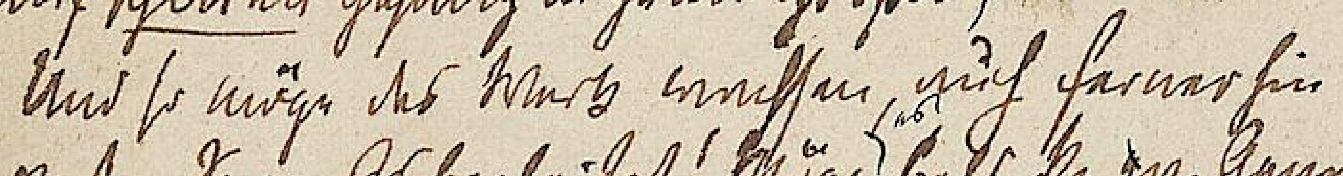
Und so möge das Werk wachsen, auch fernerhin
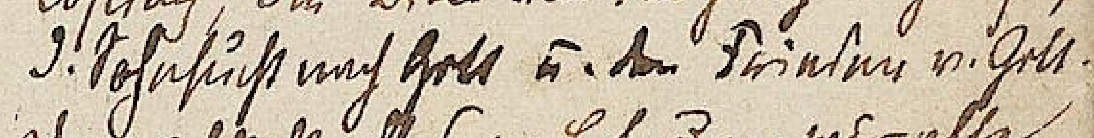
d. Sehnsucht nach Gott u. den Frieden v. Gott
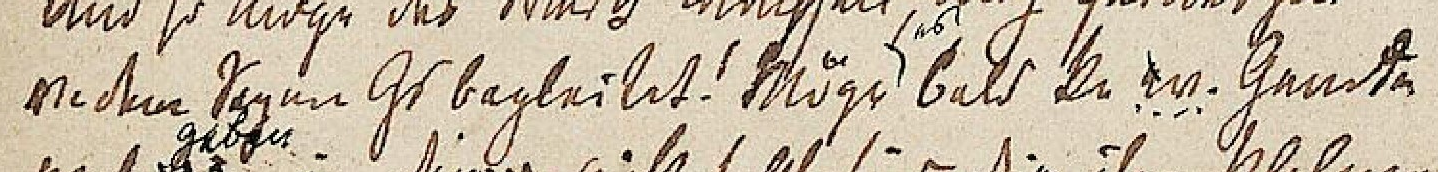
v. dem Segen Gs begleitet! Möge bald kn. ev. Gemde
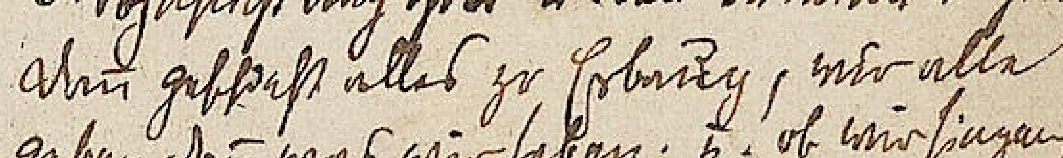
Dann geschieht alles zur Erbaug, wir alle
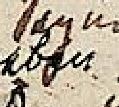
geben
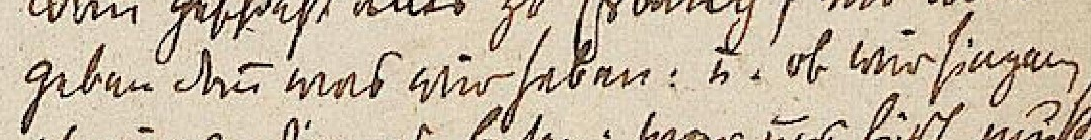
geben dan was wir haben: u. ob wir singen,
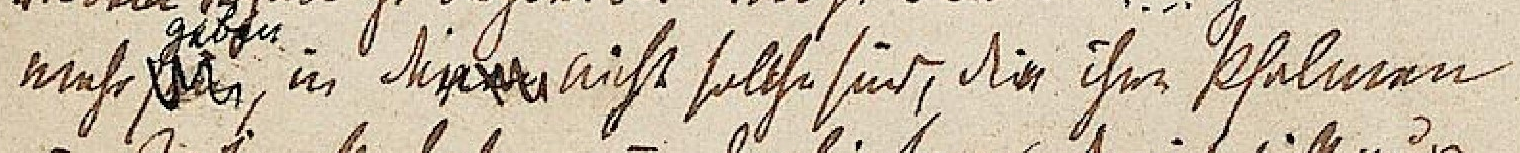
mehr sein, in der nicht solche sind, die ihre Psalmen
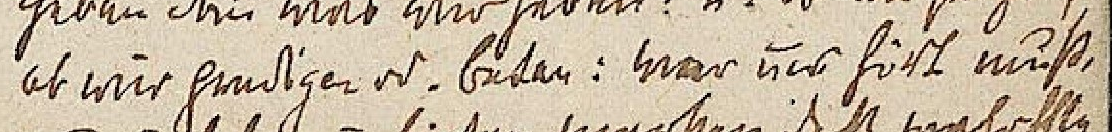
ob wir predigen od. beten: wer uns hört muß
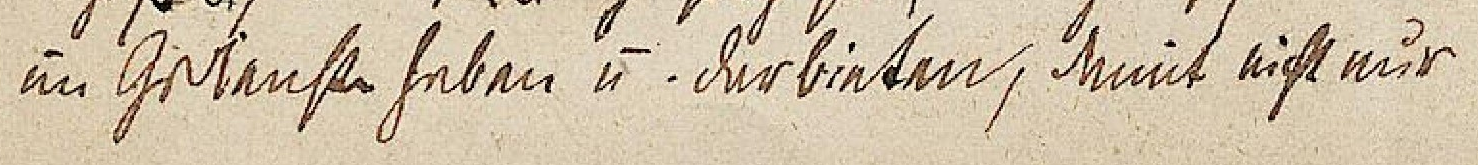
im Gsdienste haben u. darbieten, damit nicht nur
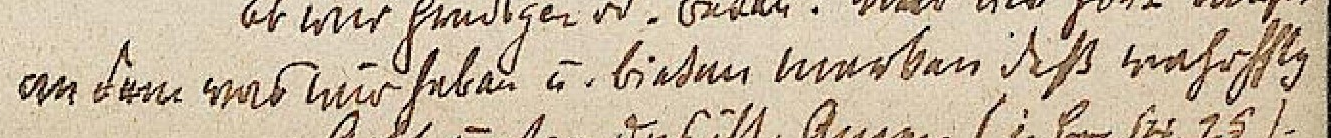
an dem was wir haben u. bieten merken daß warhftg
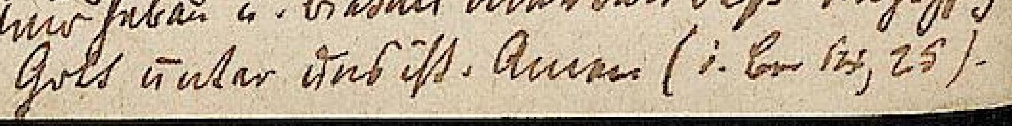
Gott unter uns ist. Amen (1. Cor 14,25).
